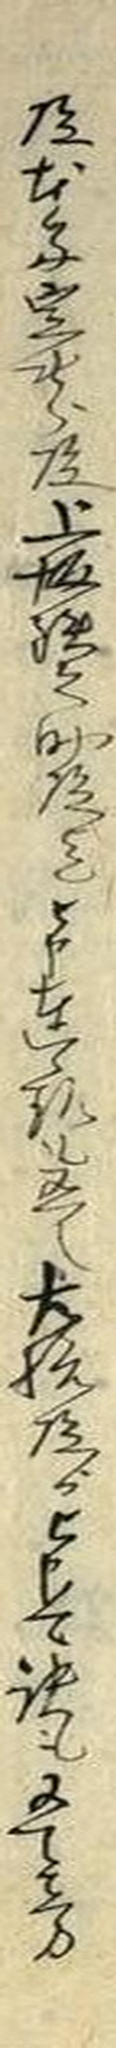殿本多定次郎殿上坂鉄之助殿迄被申達候趣も有之左膳殿ゟ被申上訳も有之旁
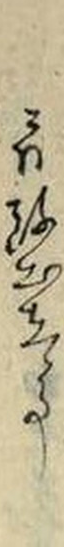ニ付致出立候事
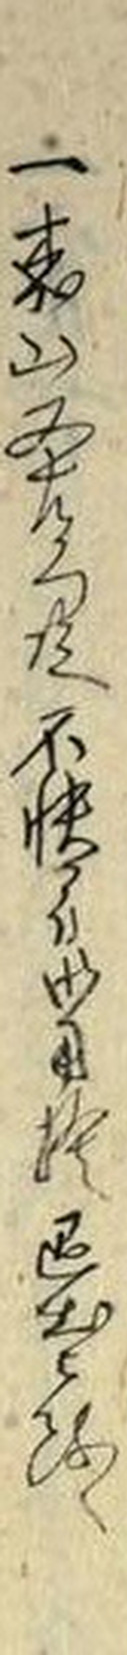一森山又左衛門殿不快ニ付御用捨退出被致候

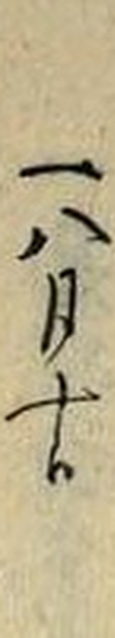一八月十日
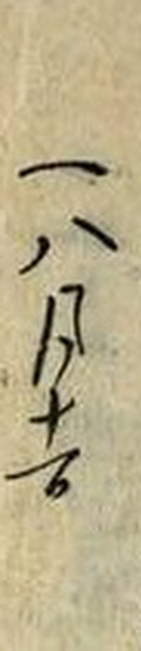一八月十日
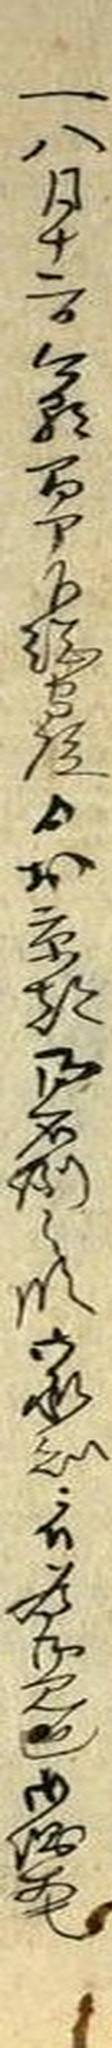八月十二日今朝間部下総守殿ゟ於京都御不例之段御承知ニ付為御見廻御側使者
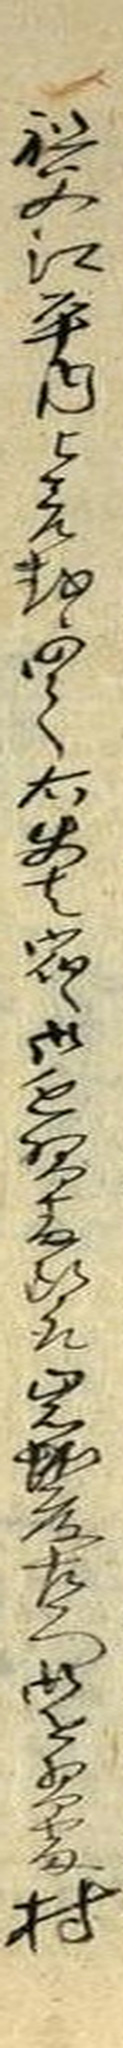祖父江平内被差越候仍之右使者宿へ御近習番頭取岩城藤左衛門御近習番村
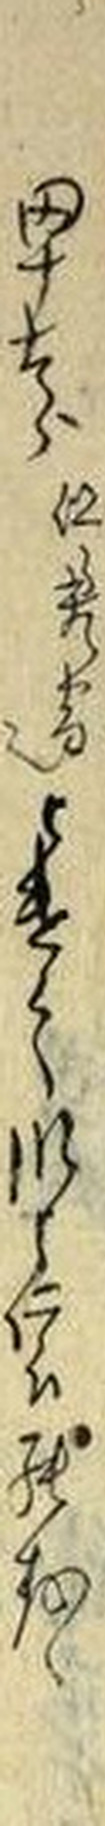田十太郎但奥番也被遣之段被仰付罷越候
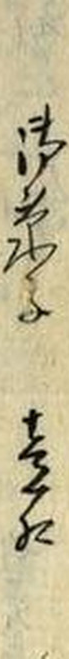御菓子壱箱
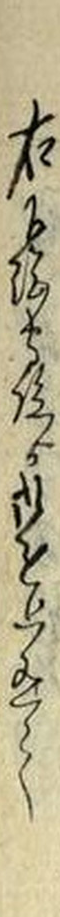右下総守殿ゟ御進上有之
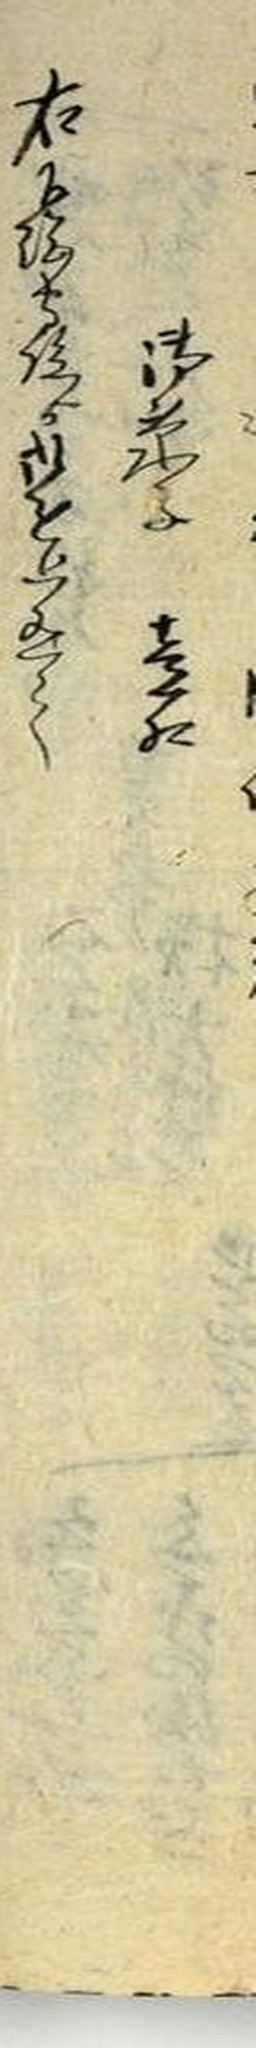右下総守殿ゟ御進上有之
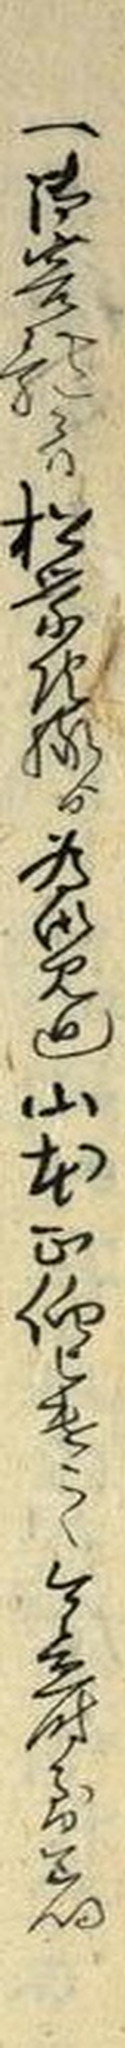一御容體ニ付松栄院様ゟ為御見廻山本正伯被遣候今昼時到着
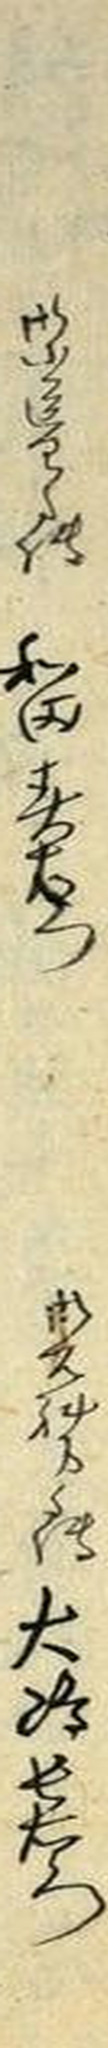御道具手伝和田春左衛門御召料方手伝大嶋長右衛門
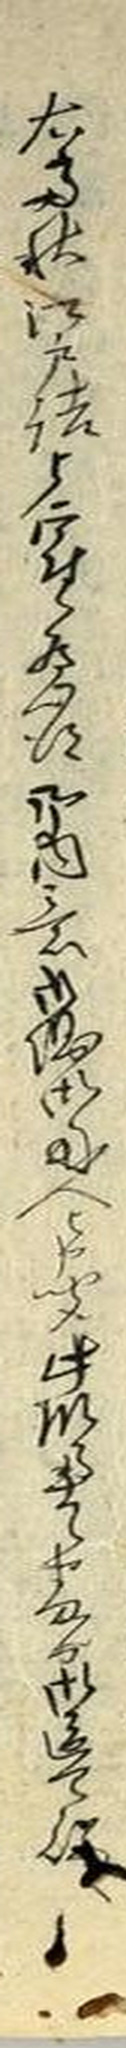右当秋江戸詰被仰付候為心得御内意御側御用人被申聞此段奥之番ゟ御道具役
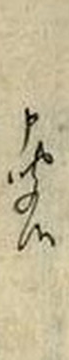申聞候
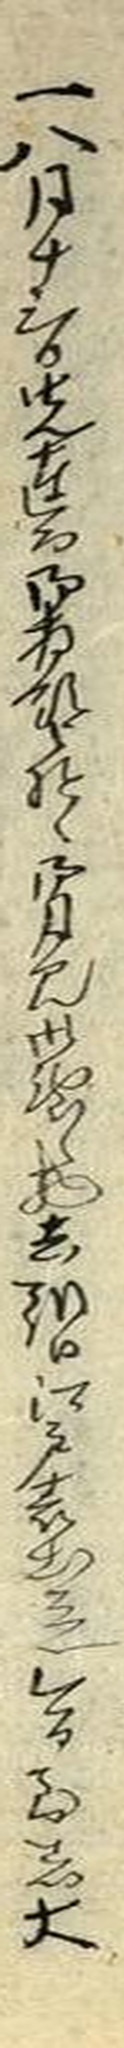一八月十三日先達而御拝領被遊候御月見御台之物去朔日江戸表出立今日到着大
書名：少傅日録抄（斉善付側向頭取日記、江戸并道中、初入在国、逝去後…
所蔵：福井県文書館 Fukui Prefectural Archives
